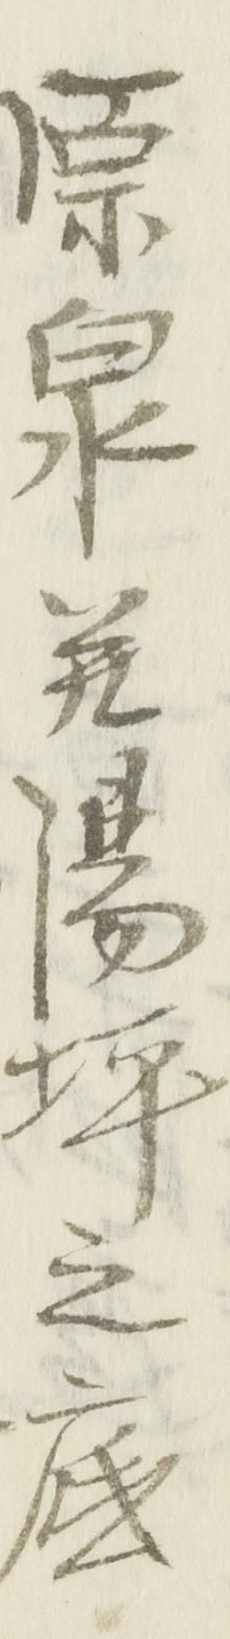原泉并湯坪之底
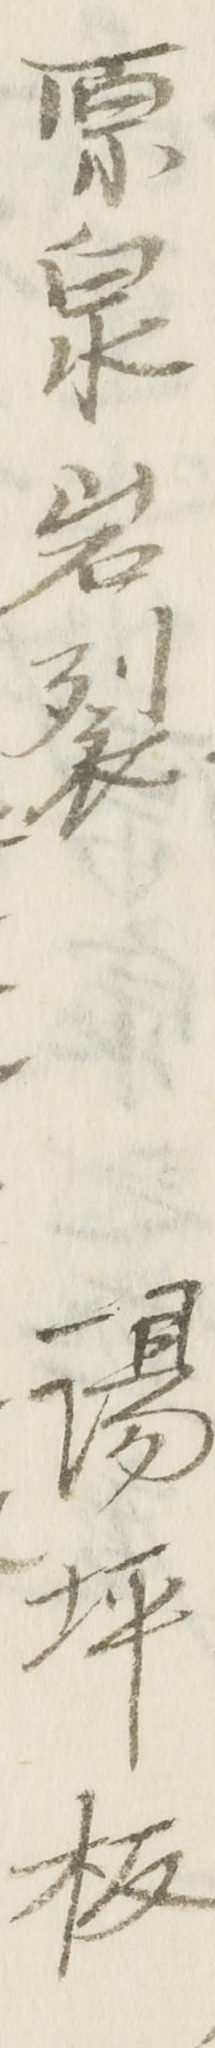原泉岩裂湯坪板
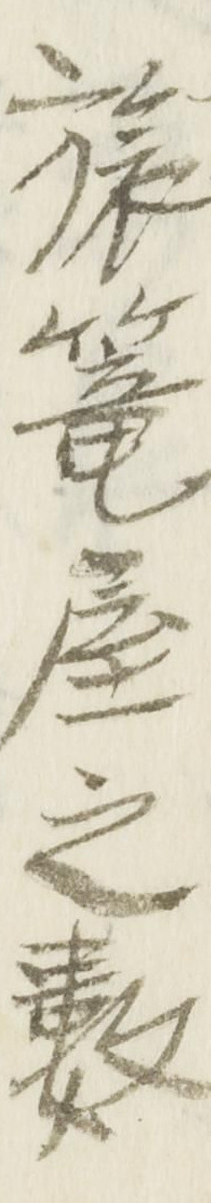旅籠屋之数
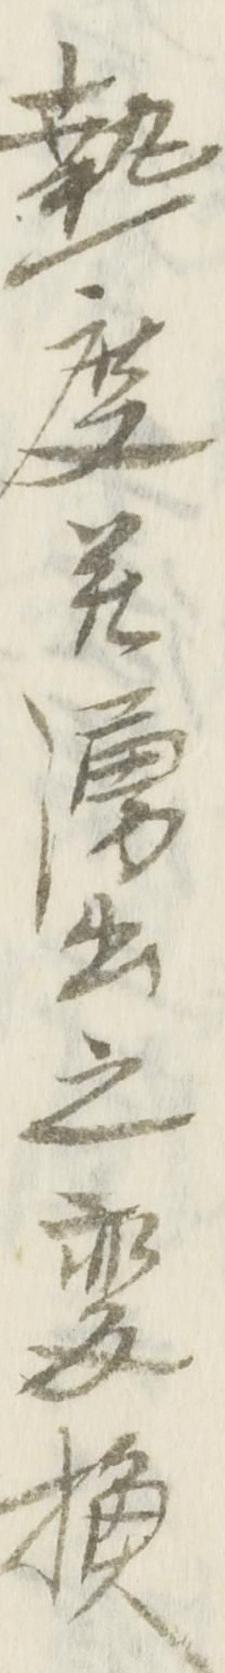熱度并湧出之変換
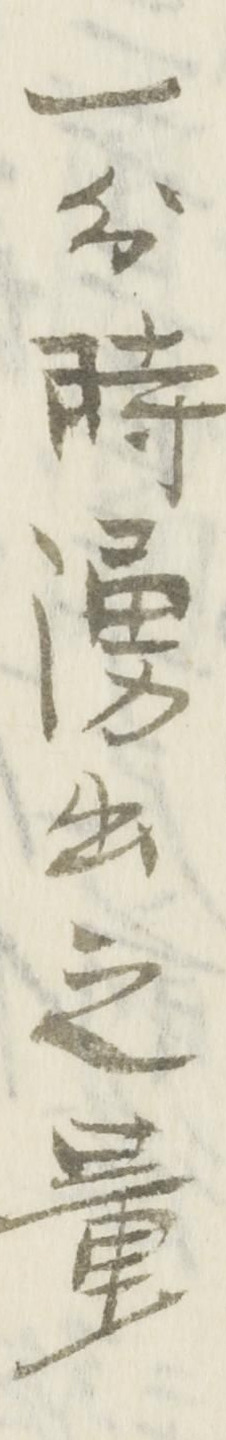一分時湧出之量
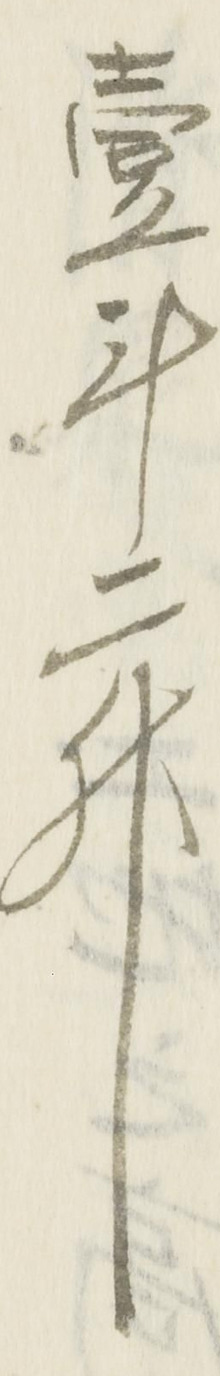壱斗二升
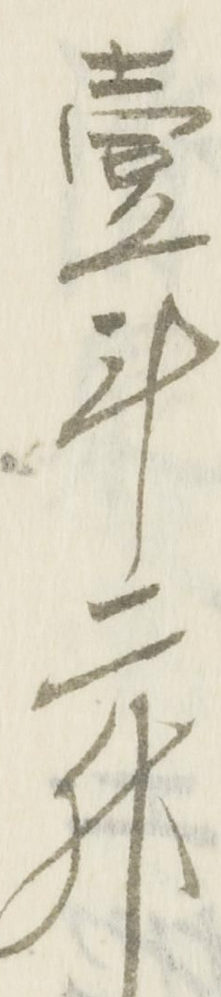壱斗二升
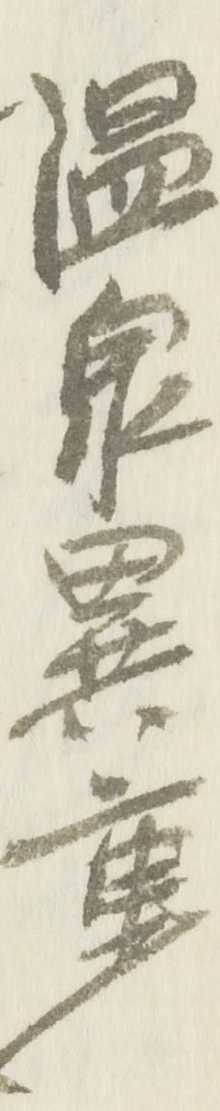温泉異重
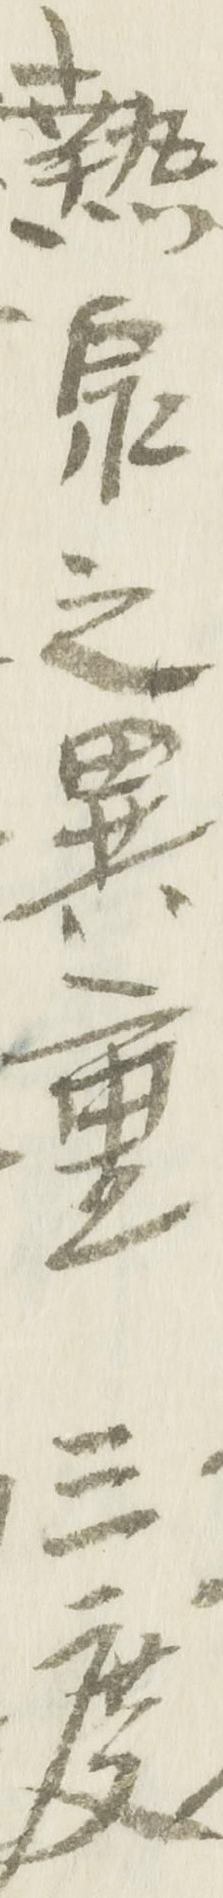熱泉之異重三度
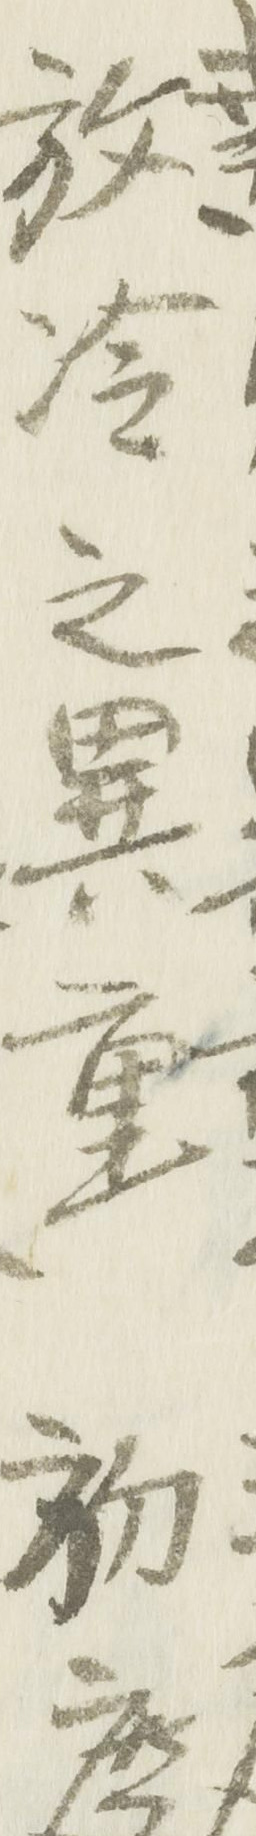放冷異重初度
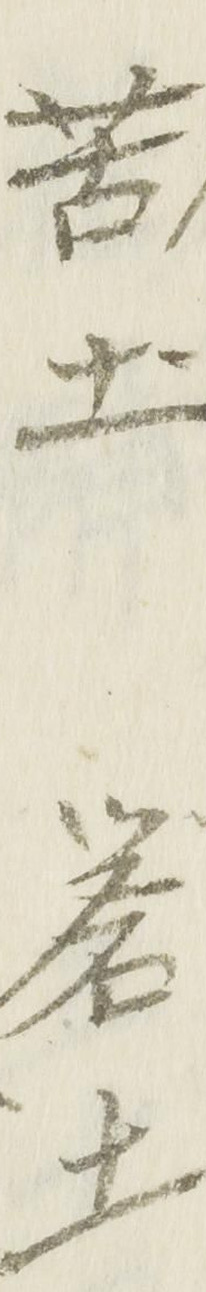苦土礬土
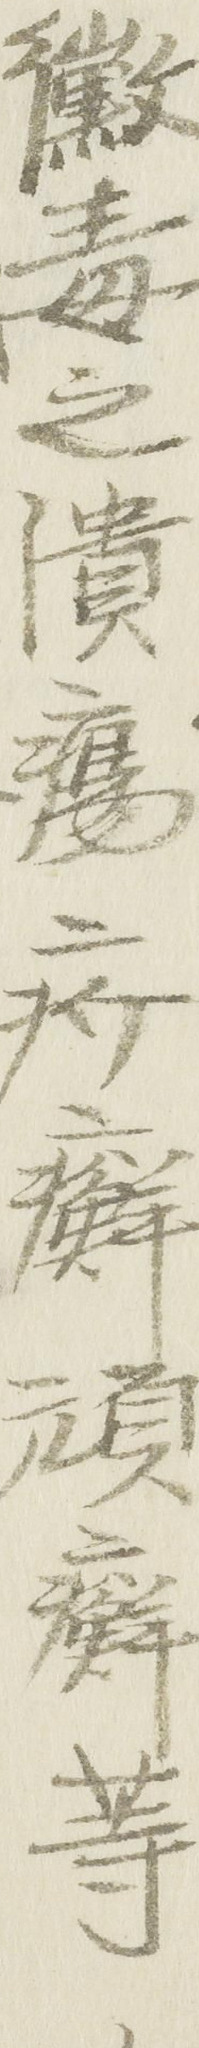黴毒之潰瘍疥癬頑癬等ノ

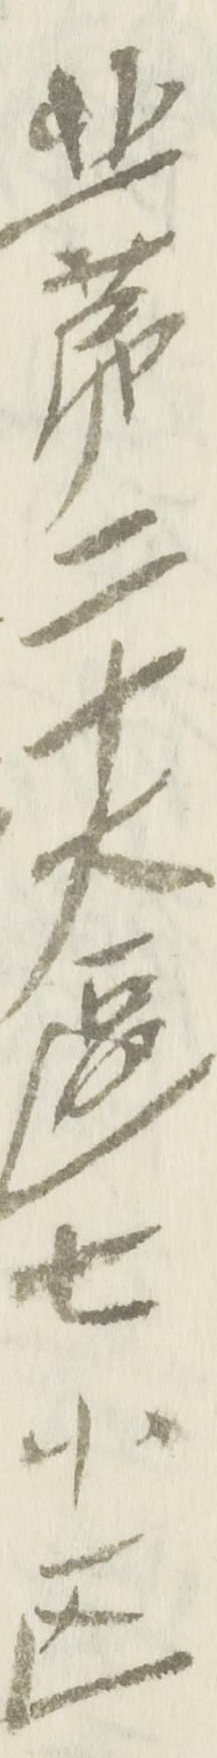北第二十大区七小区
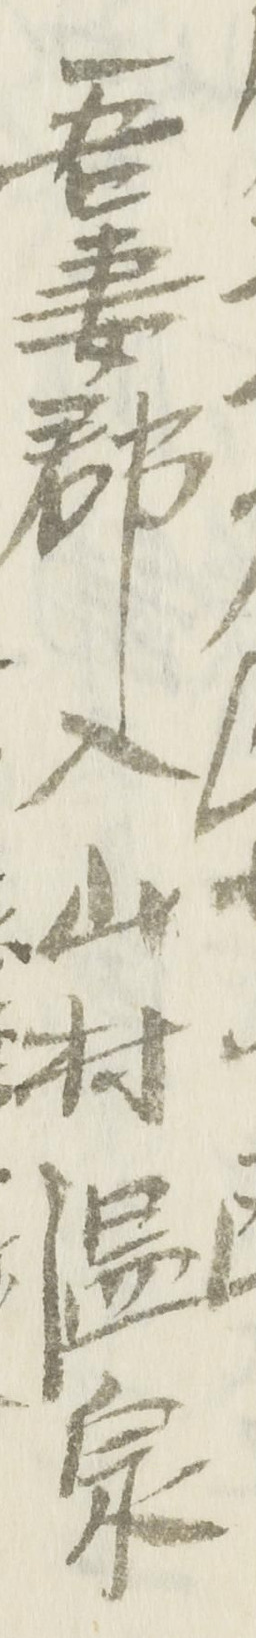吾妻郡入山村温泉
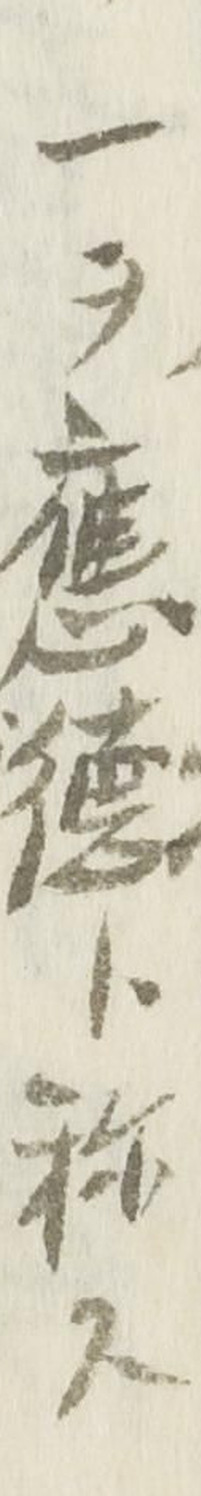一ヲ応徳ト称ス
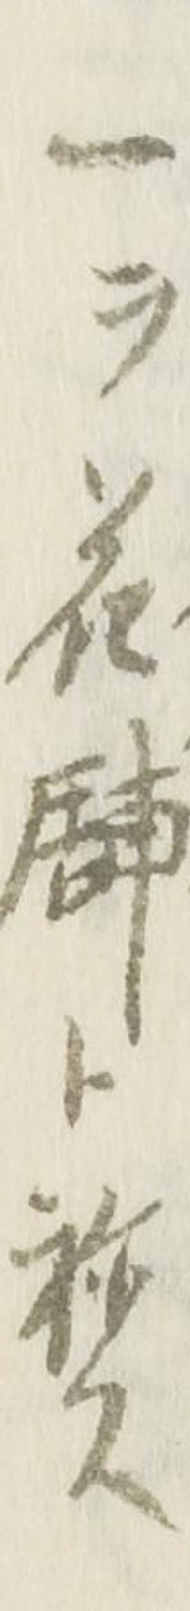一ヲ花鋪ト称ス
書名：温冷泉試験表
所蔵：東京大学地震研究所図書室 Earthquake Research Institute Library, The University of Tokyo, JAPAN
